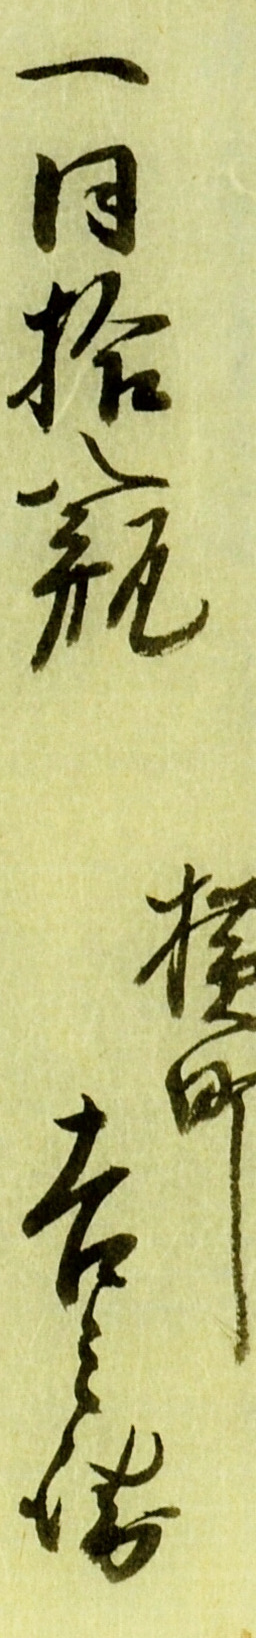一同拾八瓶吉兵衛
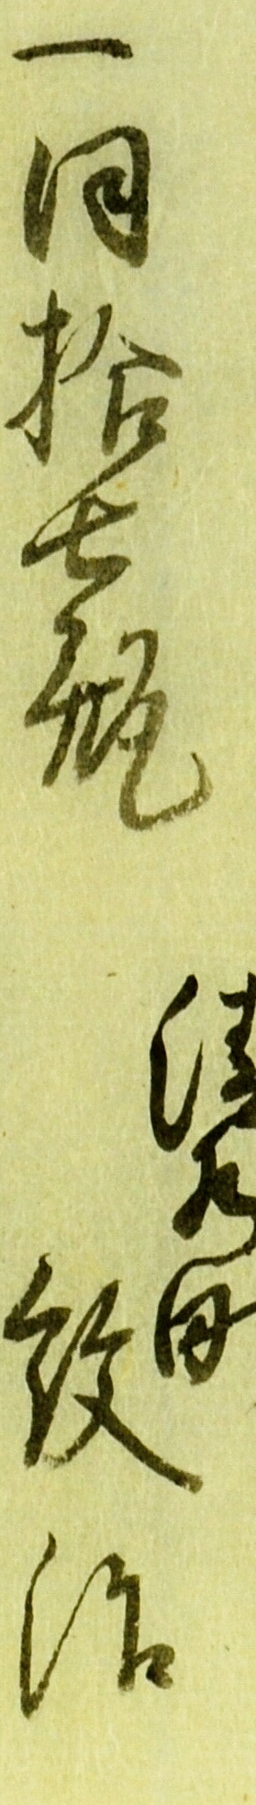一同拾七瓶紋治
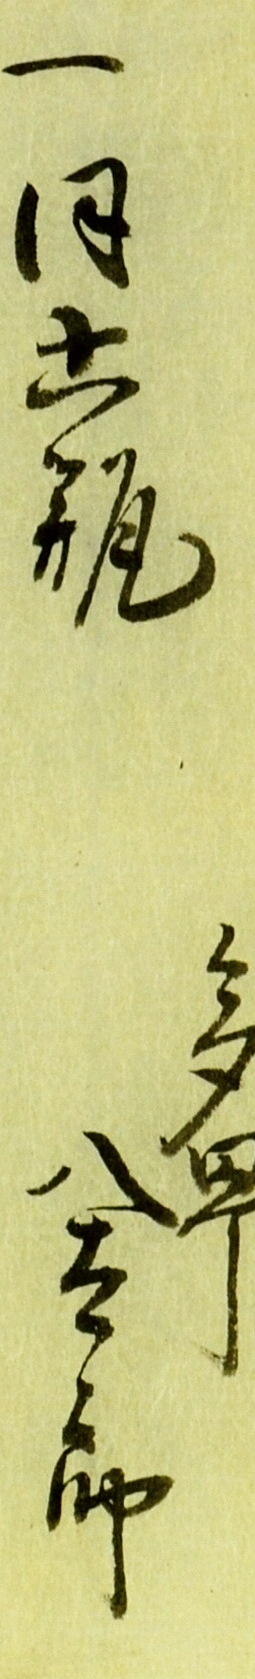一同六瓶八太郎
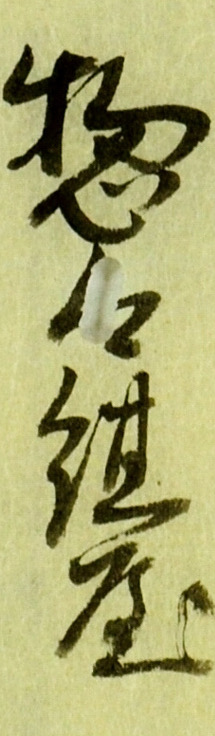総郷紺屋
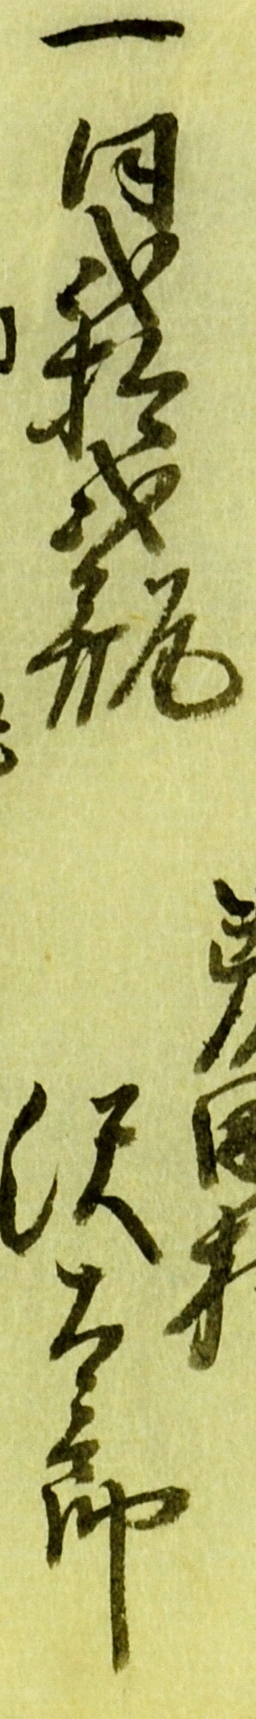一同弐拾弐瓶沢太郎
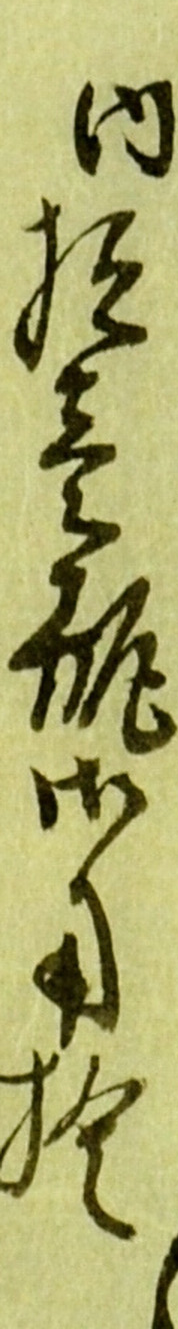内拾壱瓶御用捨
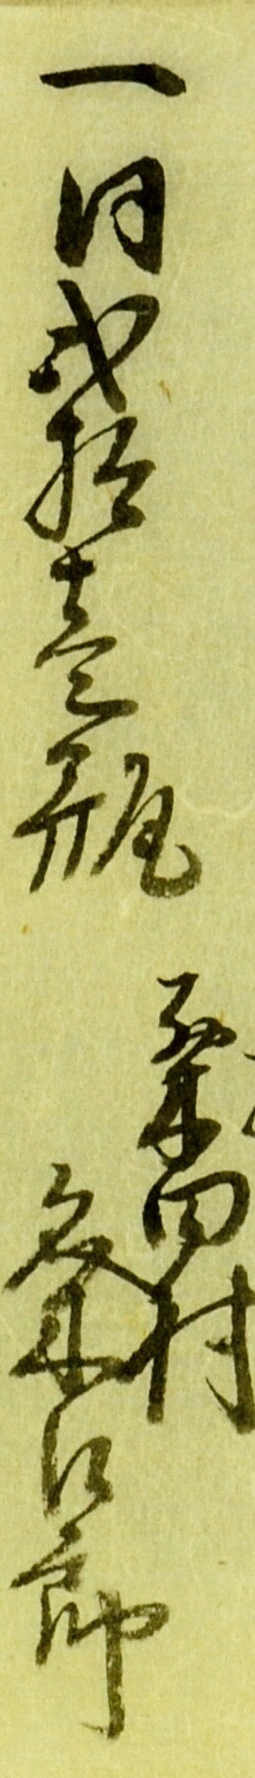一同弐拾壱瓶粂四郎
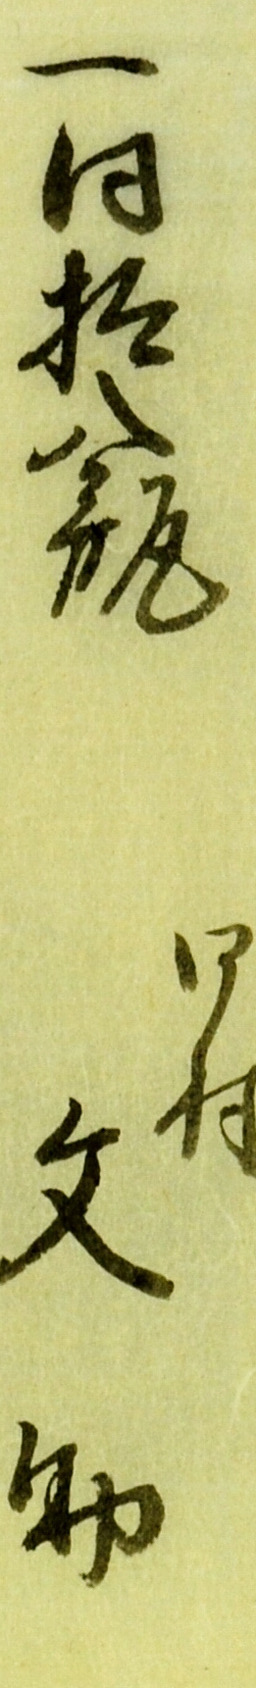一同拾八瓶文助
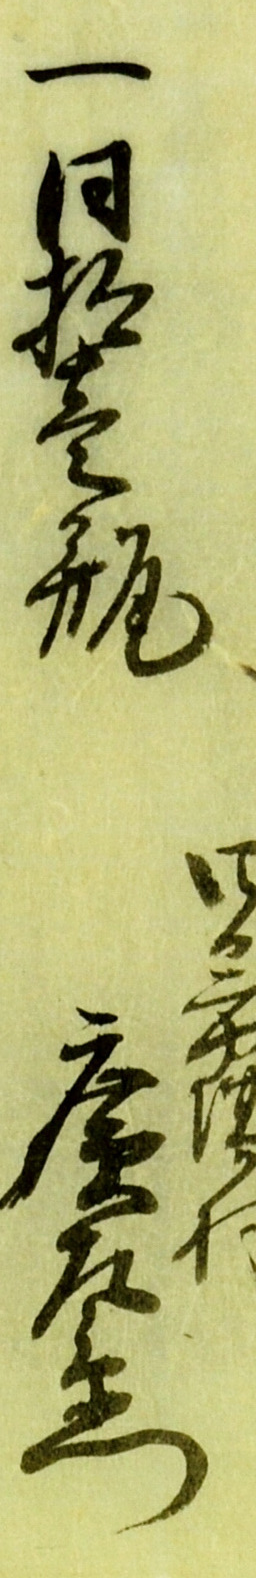一同拾壱瓶広左衛門

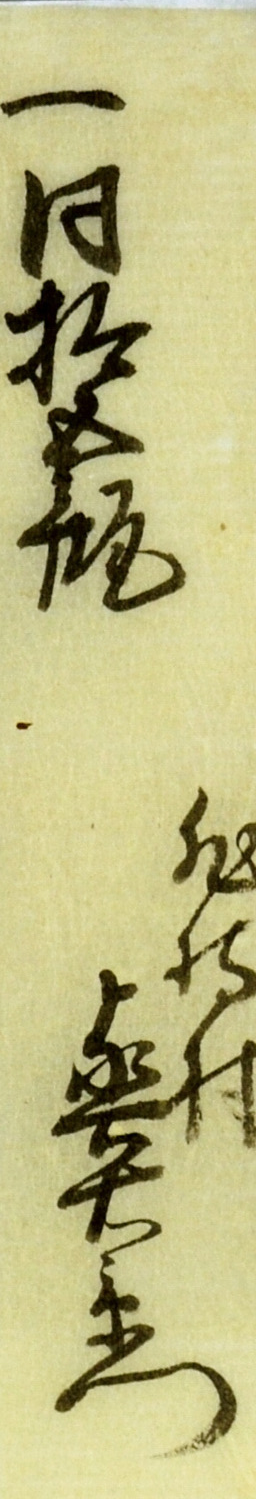一同拾五瓶与右衛門
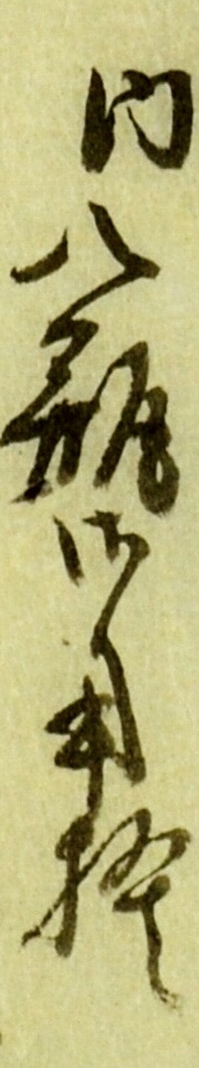内八瓶御用捨
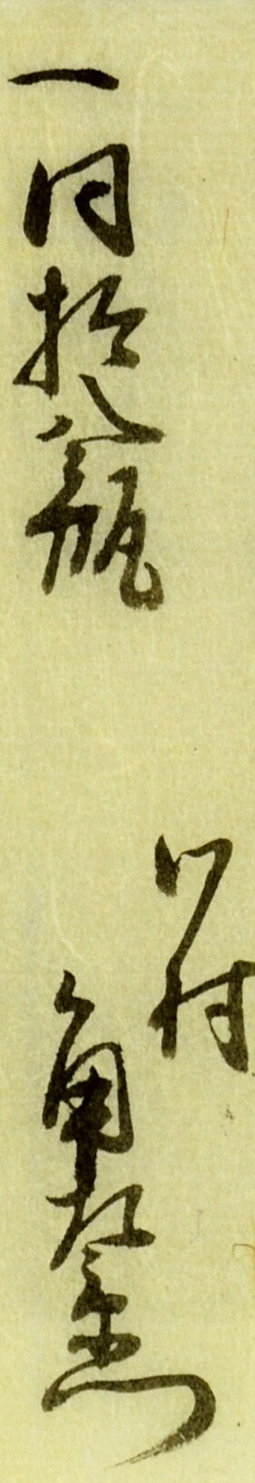一同拾八瓶角左衛門
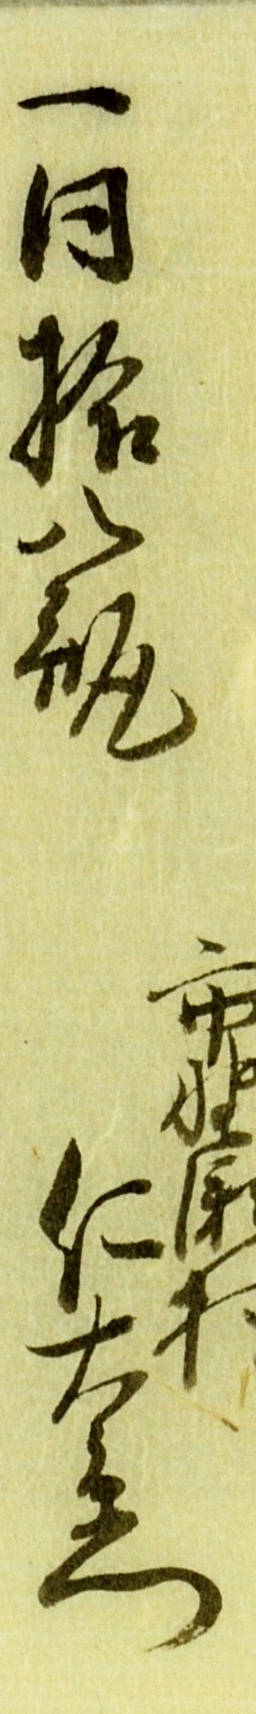一同拾八瓶仁右衛門
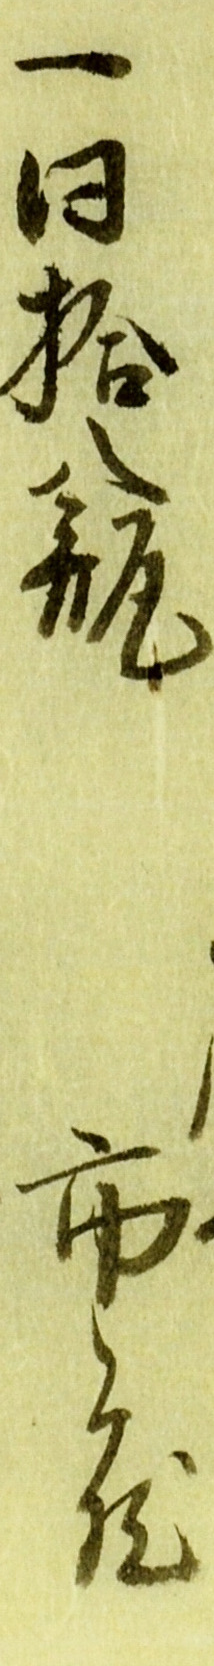一同拾八瓶市蔵
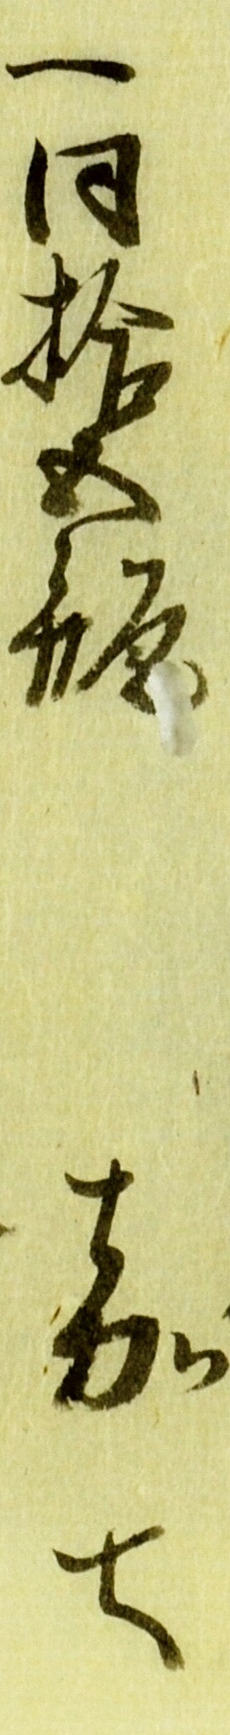一同拾五瓶嘉七
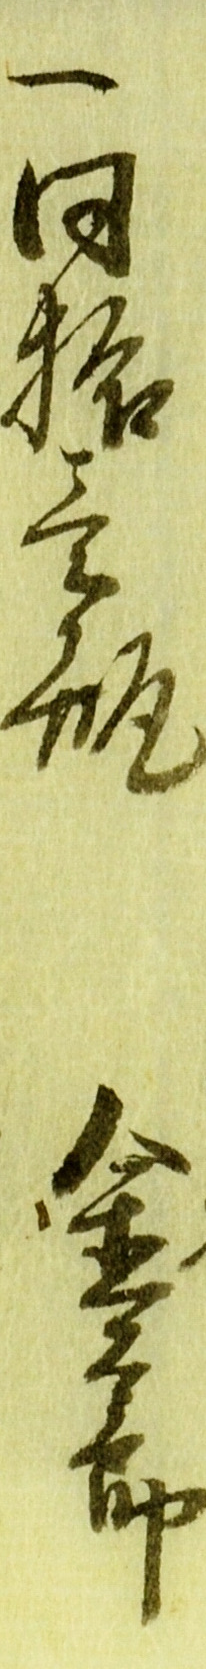一同拾壱瓶金太郎
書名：御領分中御領分中紺屋藍瓶員数御改帳
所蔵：伊那市立高遠町図書館・合同会社AMANE
